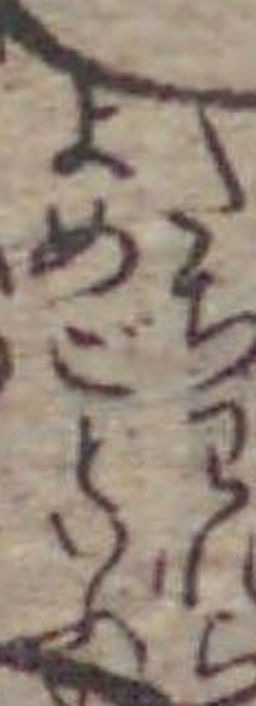よめごといふ
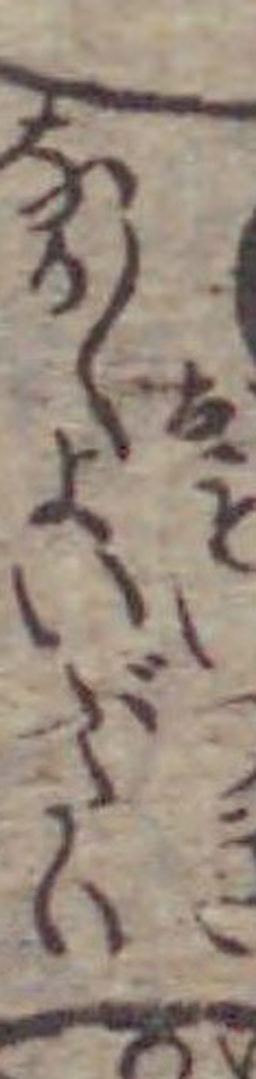なか〳〵よいぶたい
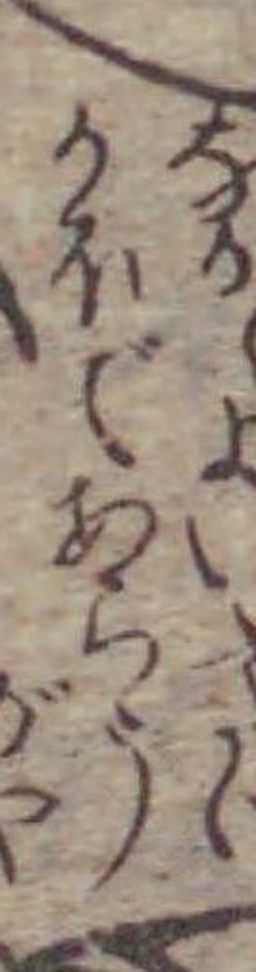かほであらう
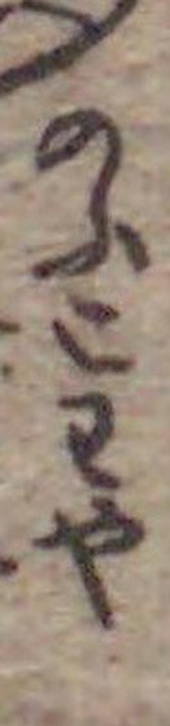のふこわや
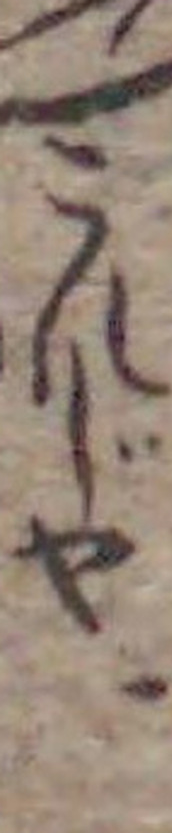これじや
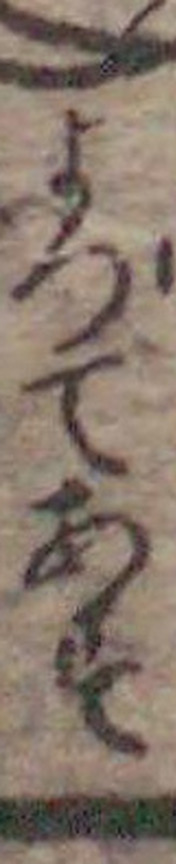よつてあす
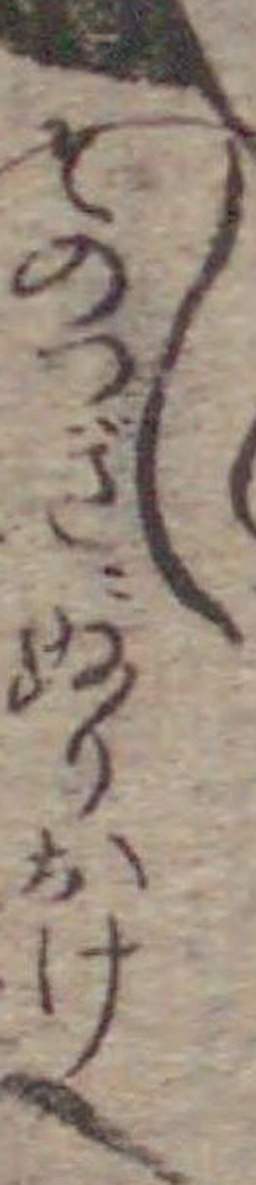そのつぎにぬりおけ
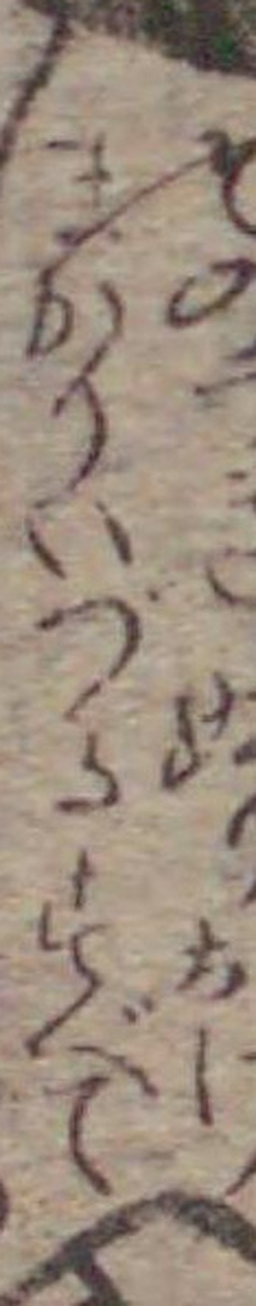まかりいつるすべて
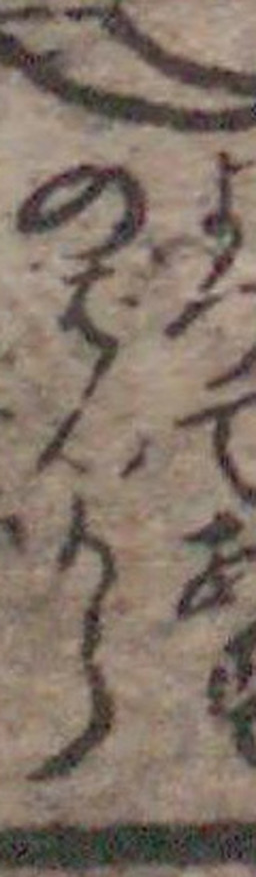のばんから
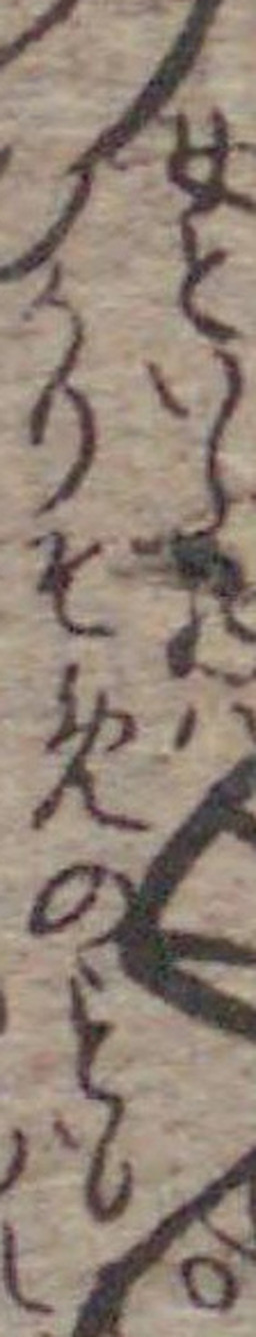かりそめのことも
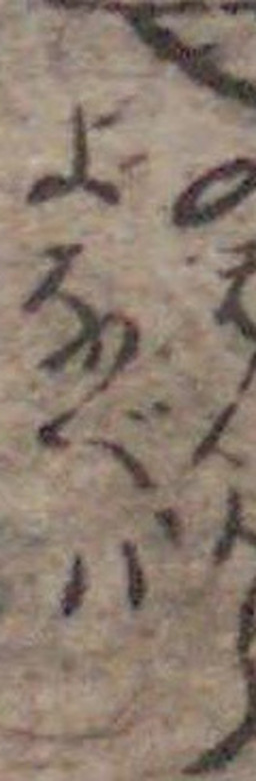よなべは
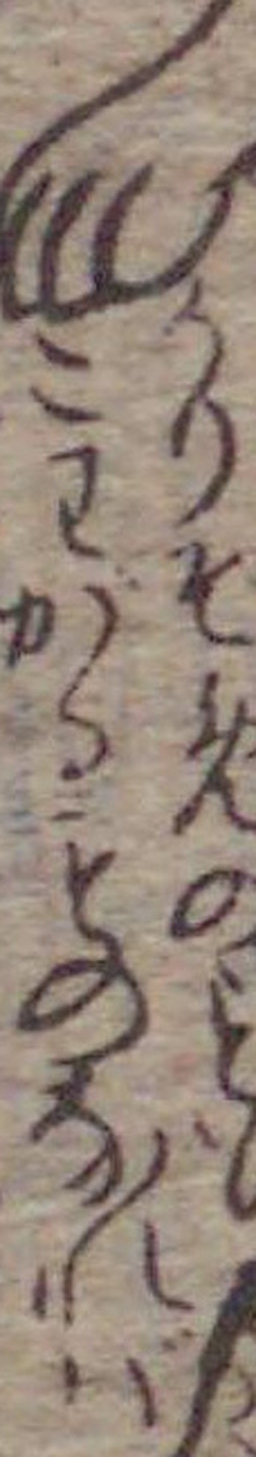こわかるものなれば
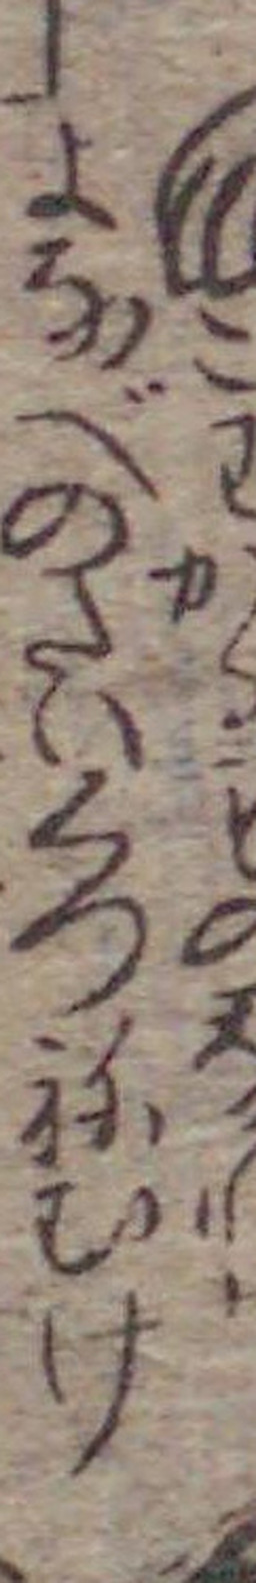よなべのたいくつねむけ
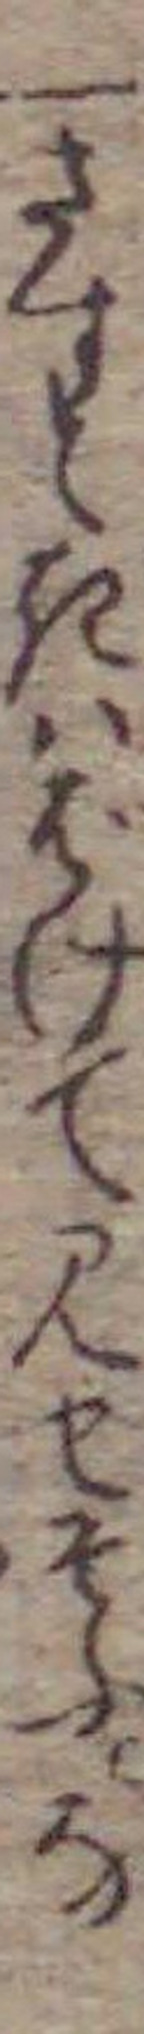さすときはばけて見せそふな
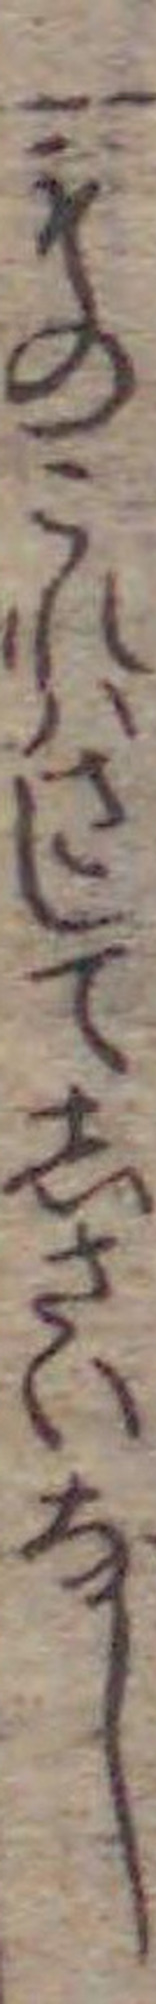ものこれはさしてしさいなし

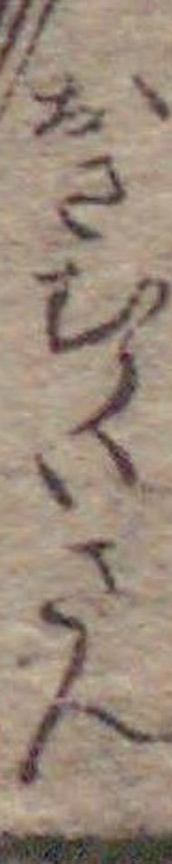おさむらいさん
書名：妖怪仕内評判記 : 2巻
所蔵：国立国会図書館 National Diet Library, JAPAN
